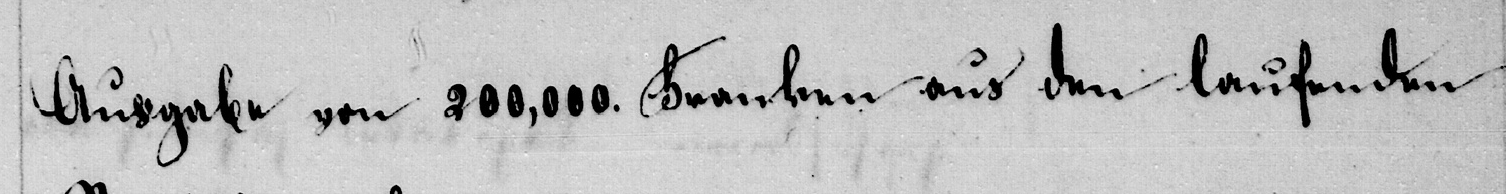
Ausgabe von 200,000 Franken aus den laufenden
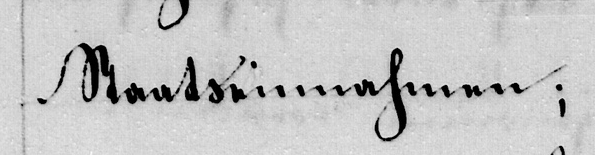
Staatseinnahmen;
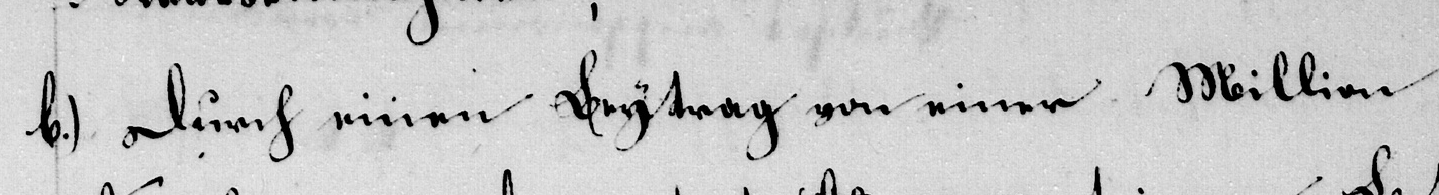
b.) Durch einen Beytrag von einer Million
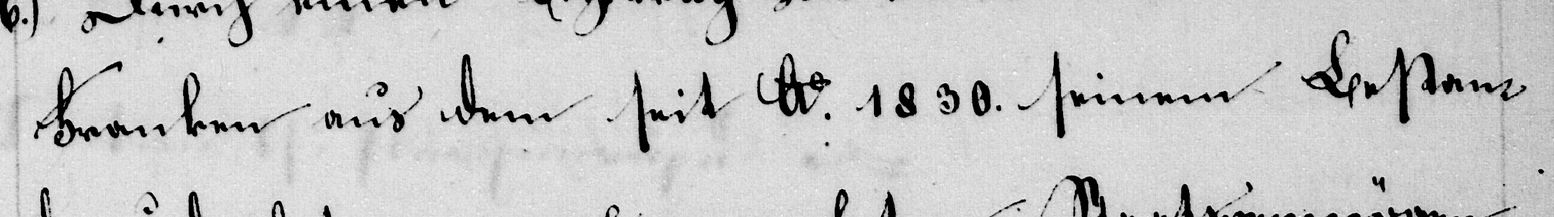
Franken aus dem seit A°. 1830. seinem Bestan¬
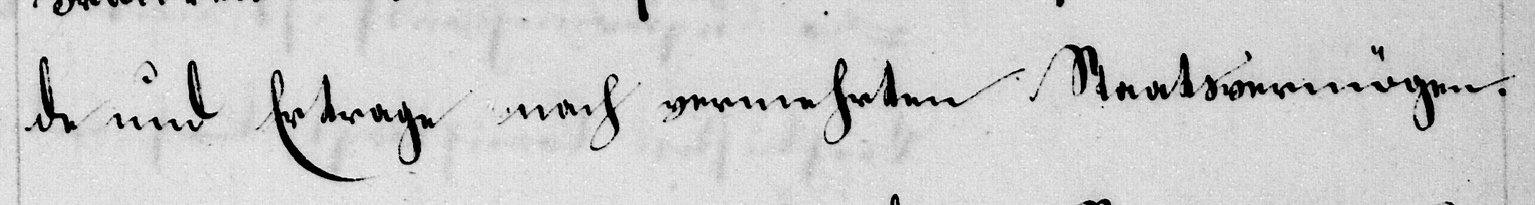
de und Ertrage nach vermehrten Staatsvermögen.
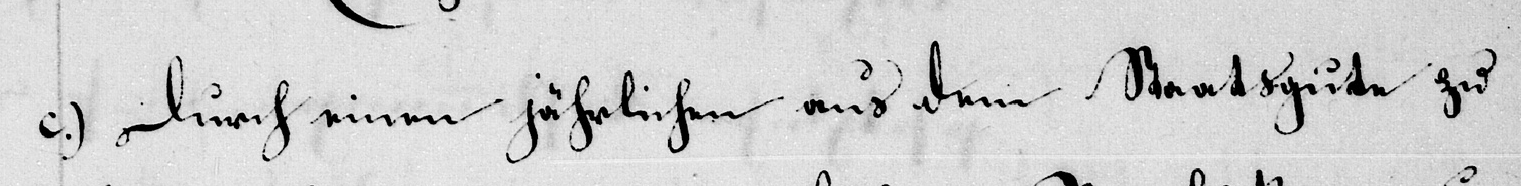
c.) Durch einen jährlichen aus dem Staatsgute zu
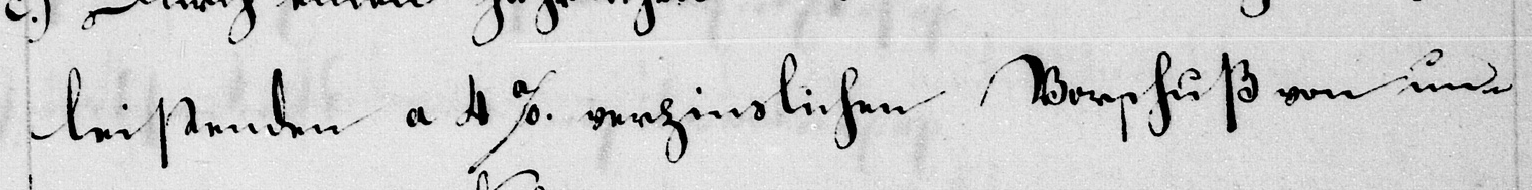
leistenden a 4%. verzinslichen Vorschuß von un¬
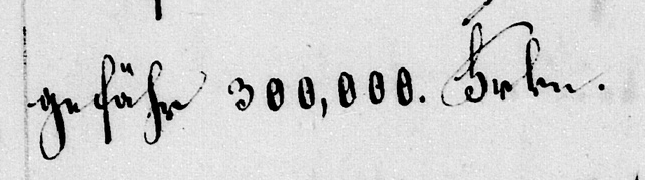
gefähr 300'000. Frkn.
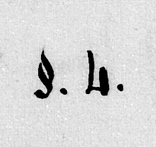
§. 4.
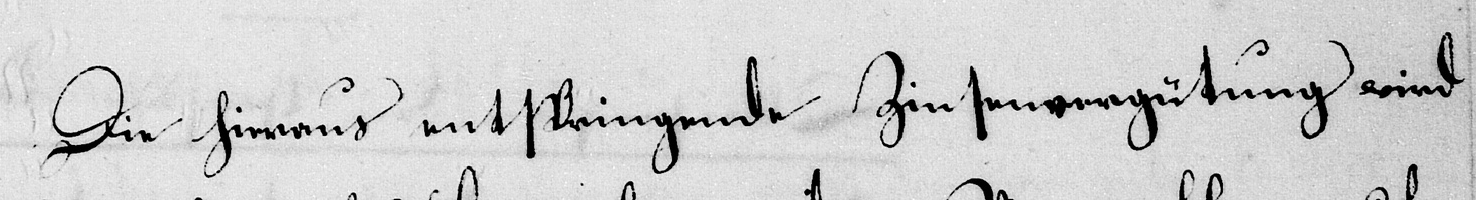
Die hieraus entspringende Zinsenvergütung wird
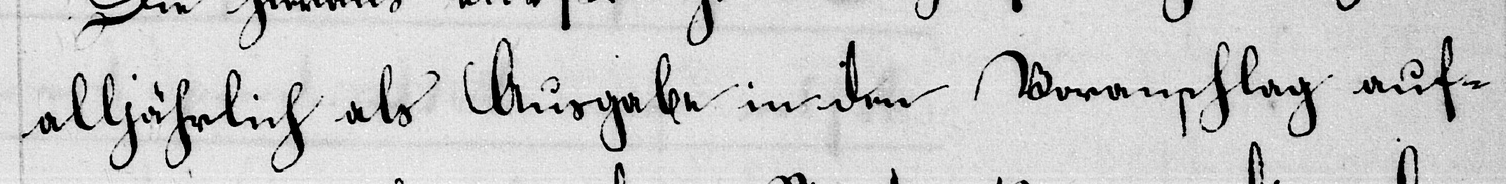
alljährlich als Ausgabe in den Voranschlag auf¬
